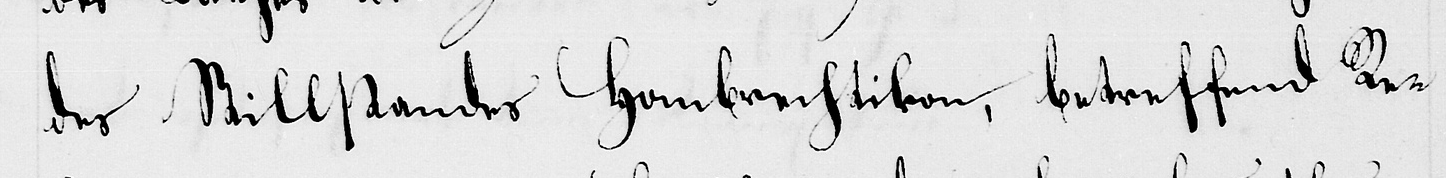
des Stillstandes Hombrechtikon, betreffend Re¬
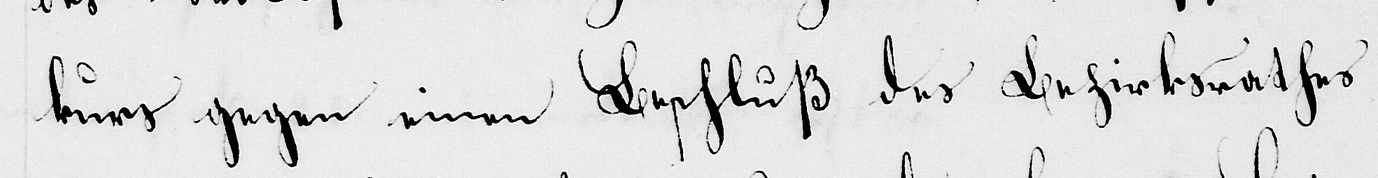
kurs gegen einen Beschluß des Bezirksrathes
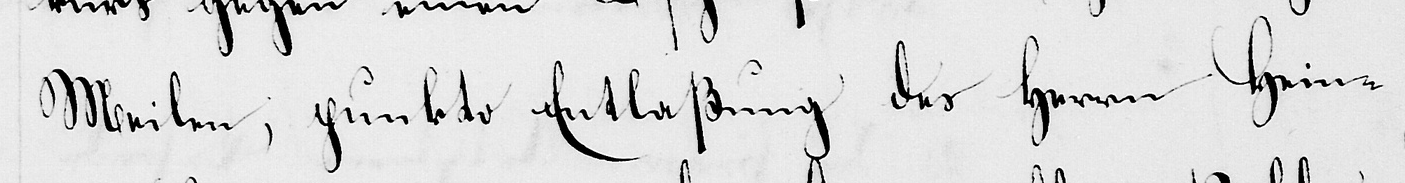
Meilen, punkto Entlaßung des Herrn Hein¬
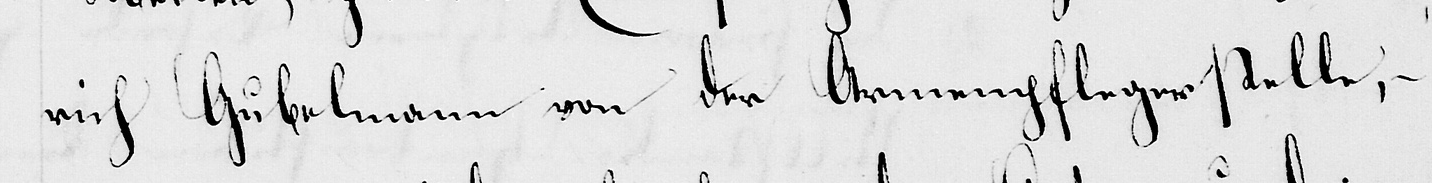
rich Gubelmann von der Armenpflegerstelle,
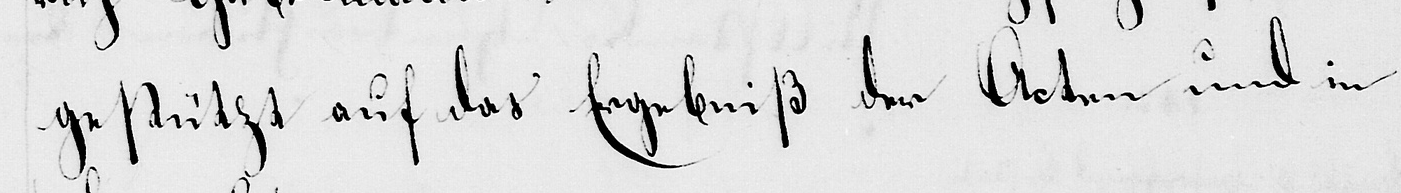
gestützt auf das Ergebniß der Acten und in
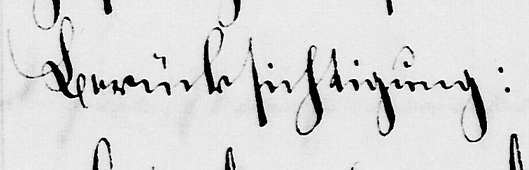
Berücksichtigung:
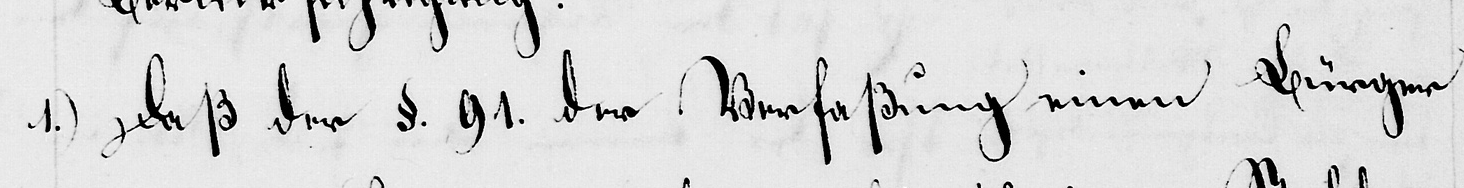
1.) Daß der §. 91. der Verfaßung einen Bürger
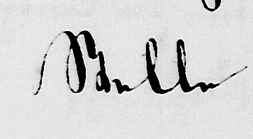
Stelle
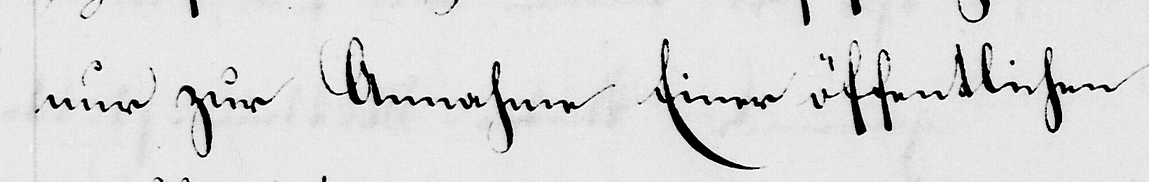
nur zu Annahme Einer öffentlichen
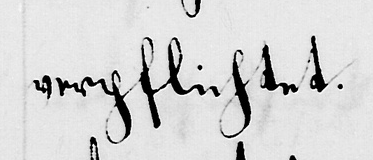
verpflichtet.
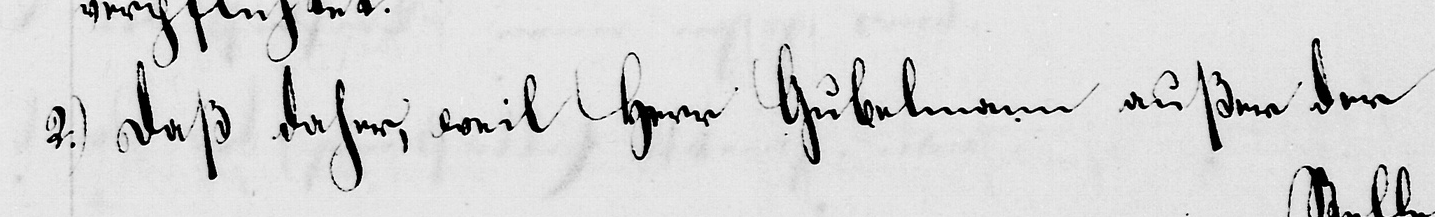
2.) Daß daher, weil Herr Gubelmann außer der
